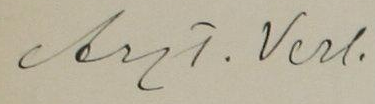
Arzt. Verb.
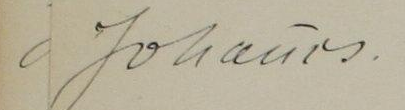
Johannis.
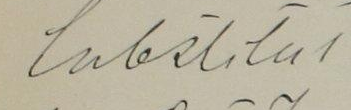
Substitut
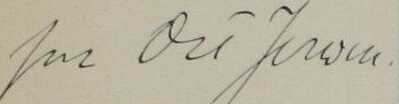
für Ost Jerwen
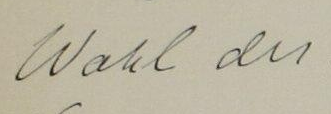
Wahl der
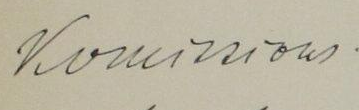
Komissions-
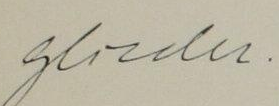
glieder
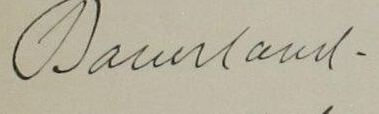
Bauerland-
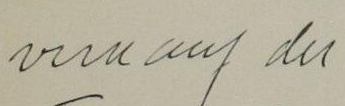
verkauf der
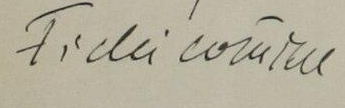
Fideicommisse
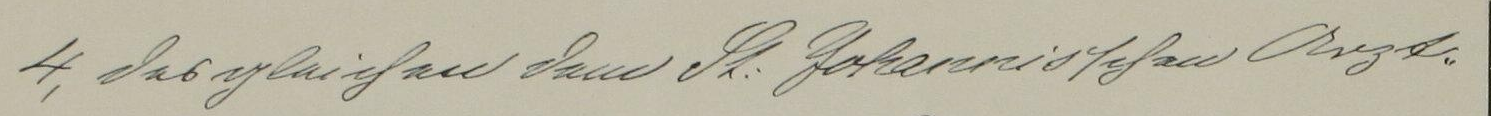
4. desgleichen dem St. Johannisschen Arzt-
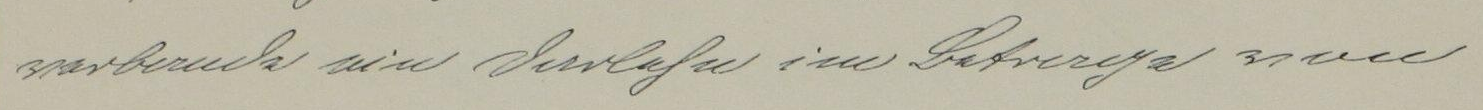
verbande ein Darlehn im Betrage von
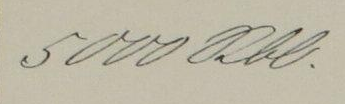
5000 Rbl.
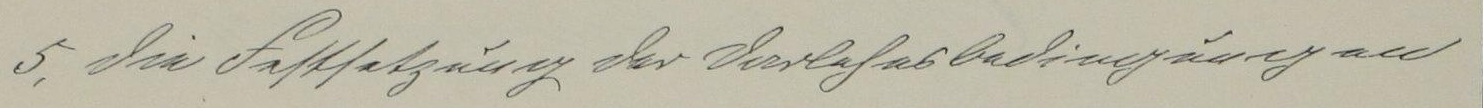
5. die Festsetzung der Darlehnsbedingungen
